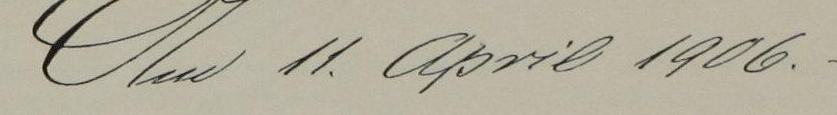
Am 11. April 1906.
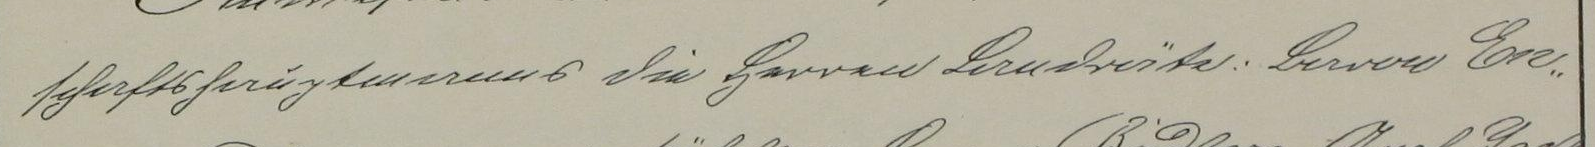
schaftshauptmanns die Herren Landräte: Baron En-
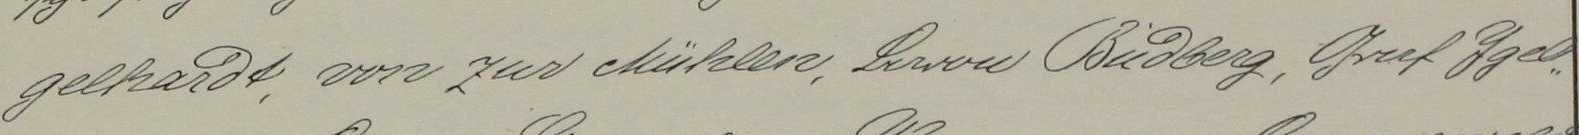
gelhardt, von zur Mühlen, Baron Budberg, Graf Igel-
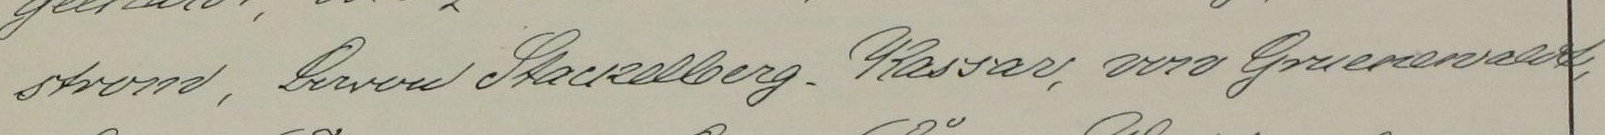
strom, Baron Stackelberg-Kassar, von Gruenewaldt,
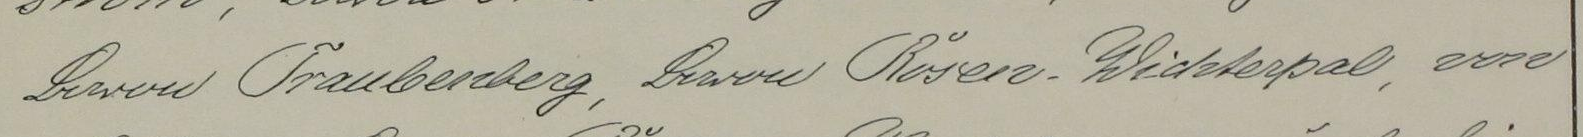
Baron Traubenberg, Baron Rosen-Wichterpal, von
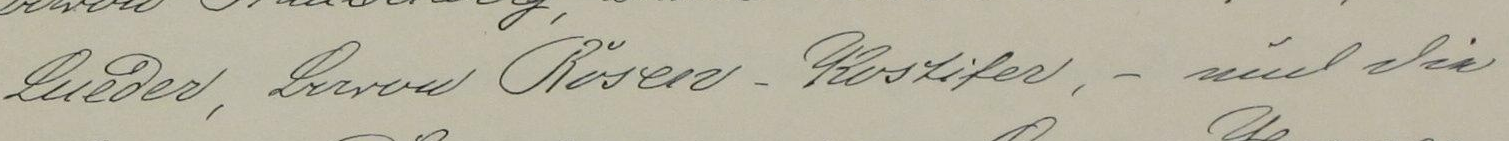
Lueder, Baron Rosen-Kostifer, - und die
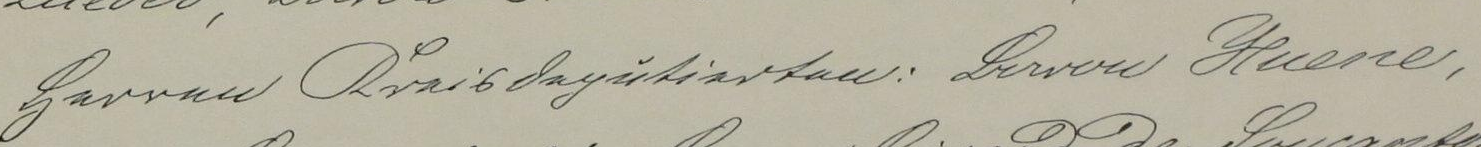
Herren Kreisdeputierten: Baron Huene,
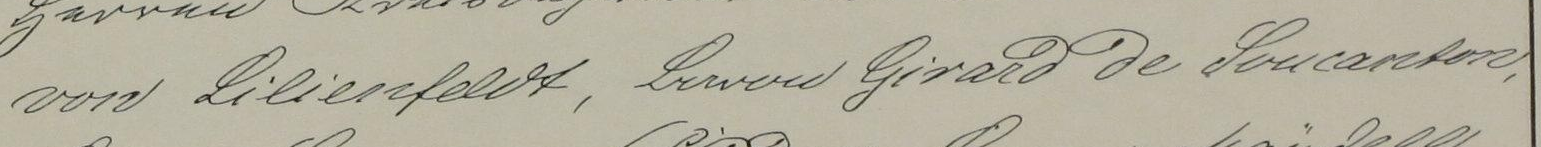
von Lilienfeldt, Baron Girard de Soucanton,
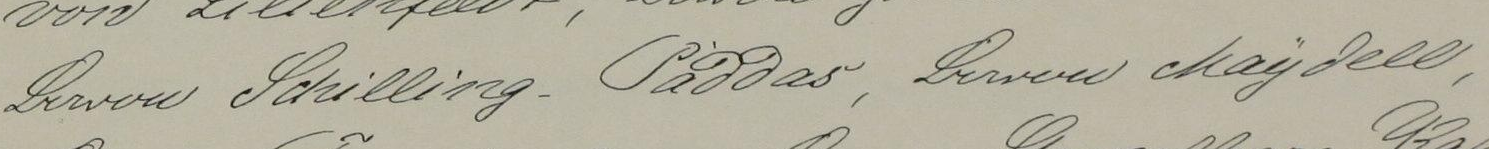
Baron Schilling-Paddas, Baron Maydell,
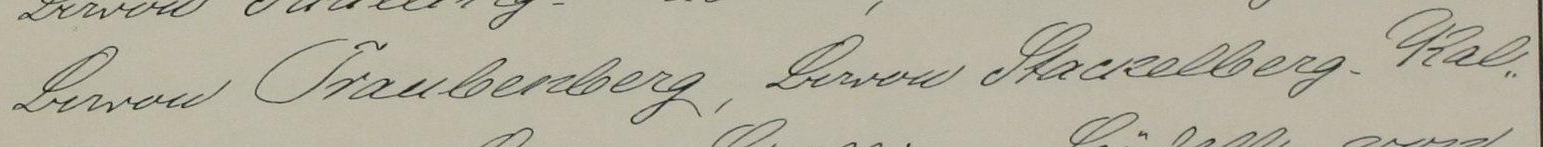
Baron Traubenberg, Baron Stackelberg-Kal-
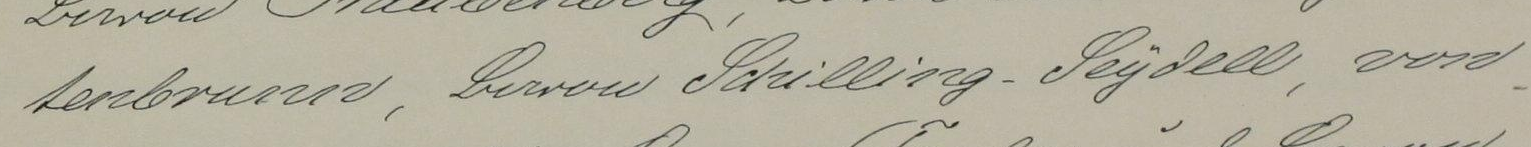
tenbrunn, Baron Schilling-Seydell, von
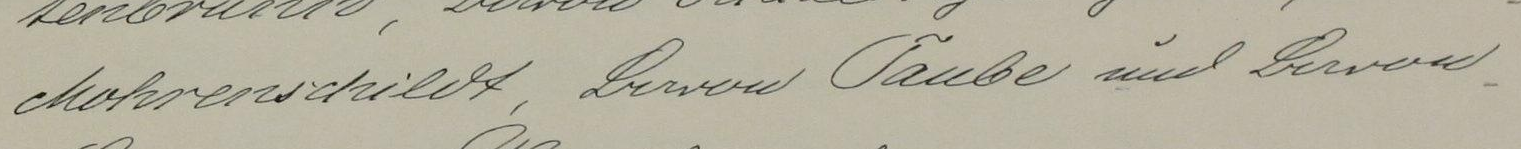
Mohrenschildt, Baron Taube, Baron
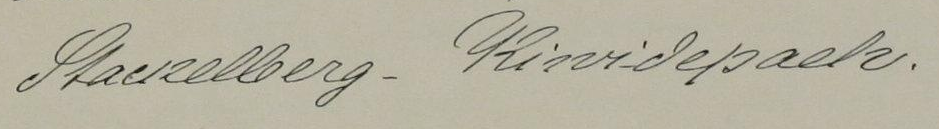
Stackelberg-Kiwidepaeh.
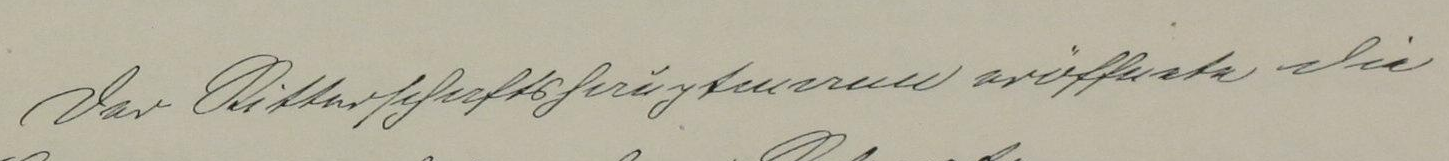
Der Ritterschaftshauptmann eröffnete die
